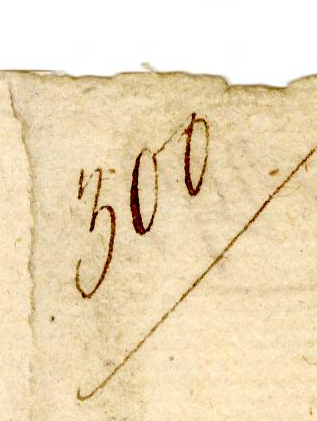300
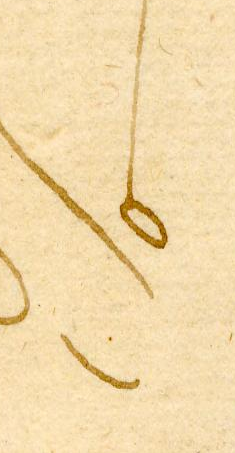To
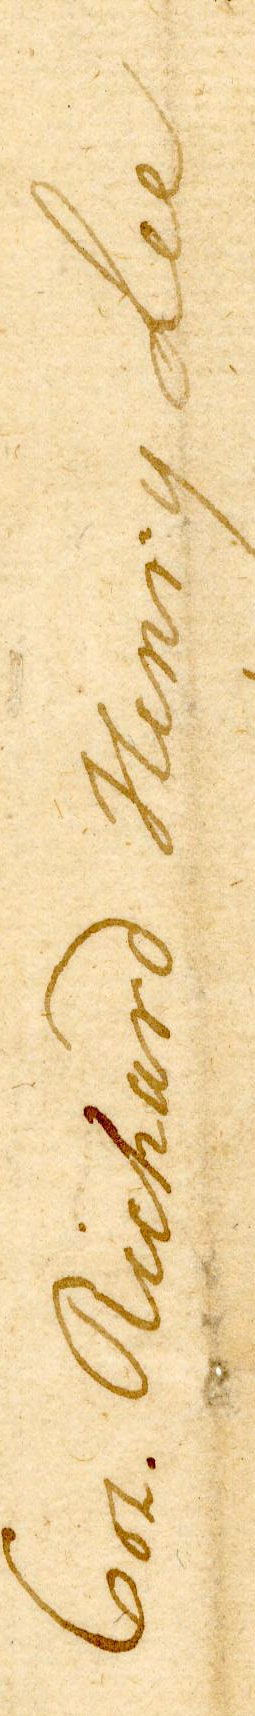Col. Richard Henry LEe
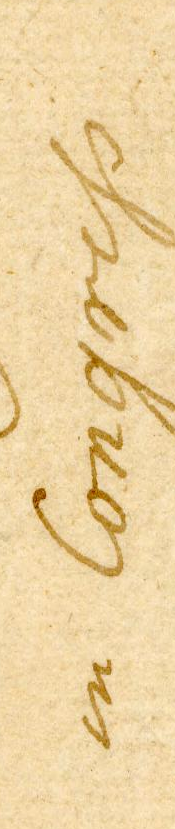In Congress
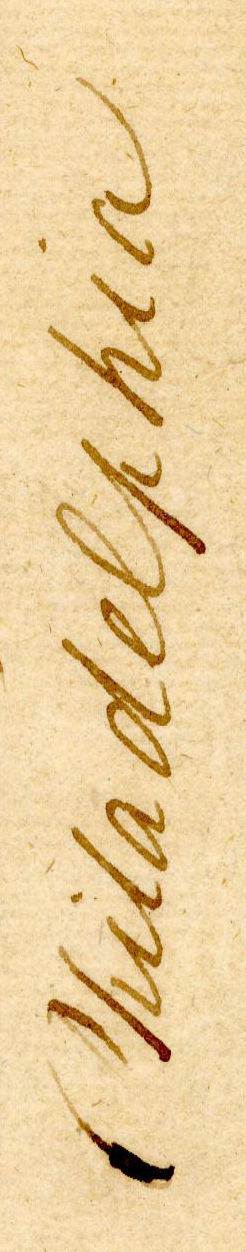Philadelphia
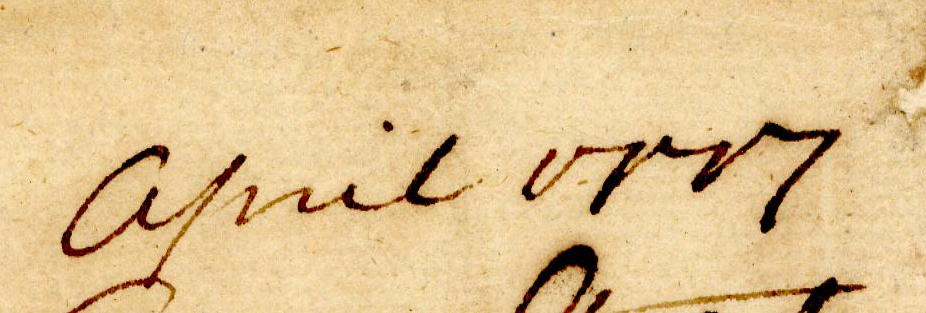April 1777
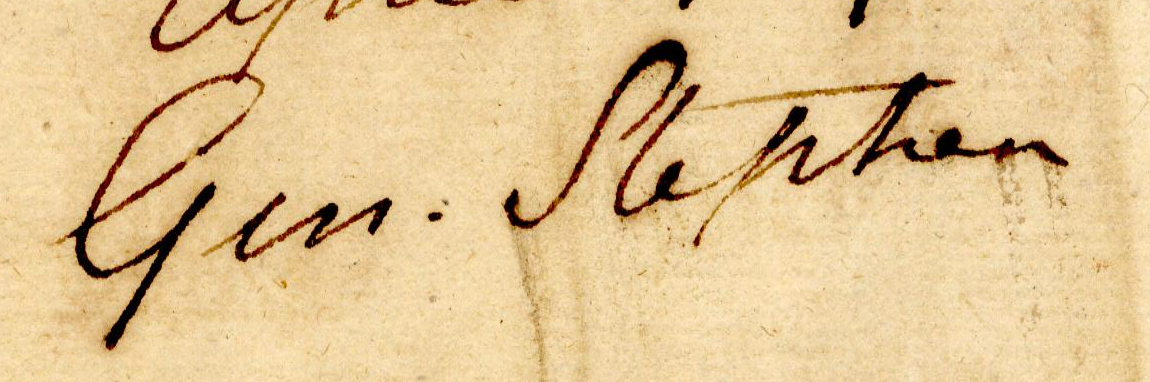Gen. Stephen
